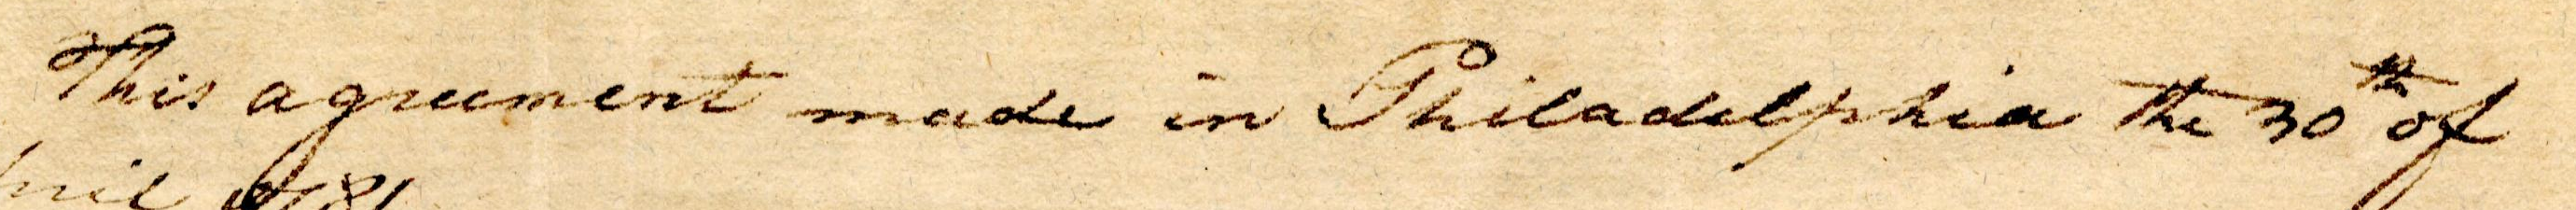This agrement made in Philadelphia the 30^th. of
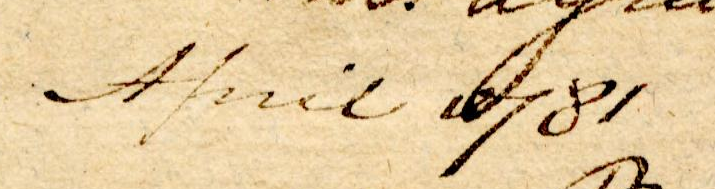April 1781
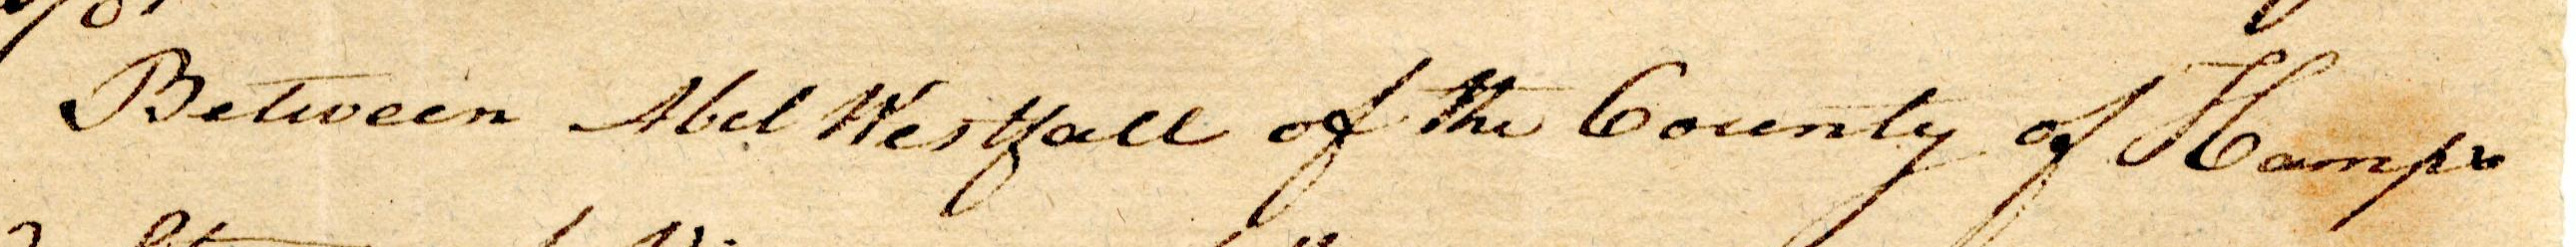Between Abel Westfall of the County of Hamps-
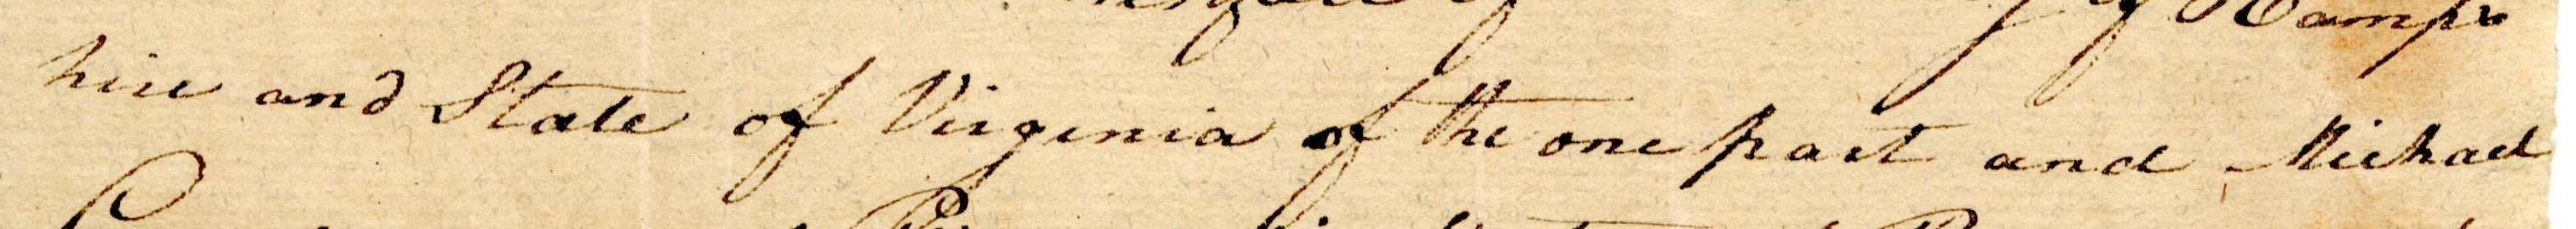-hire and State of Virginia of the one part and Michael
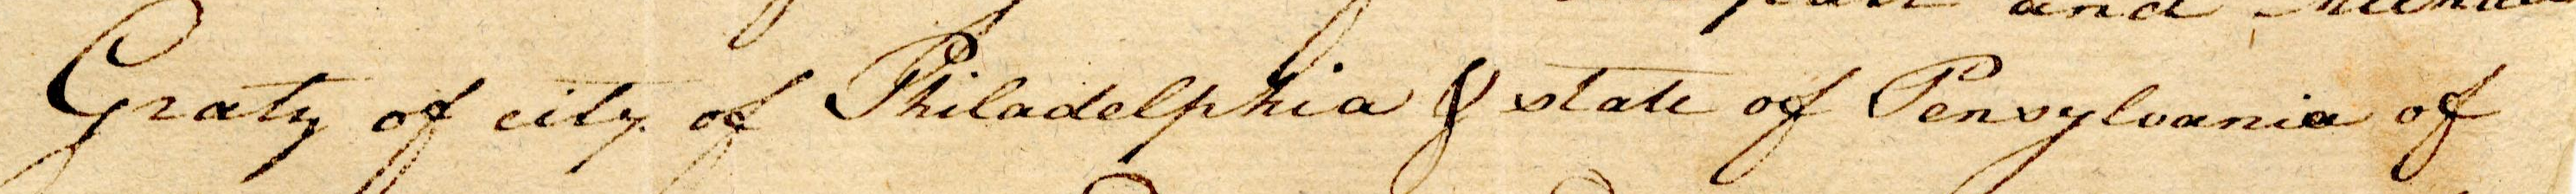Gratz of city of Philadelphia & state of Pensylvania of
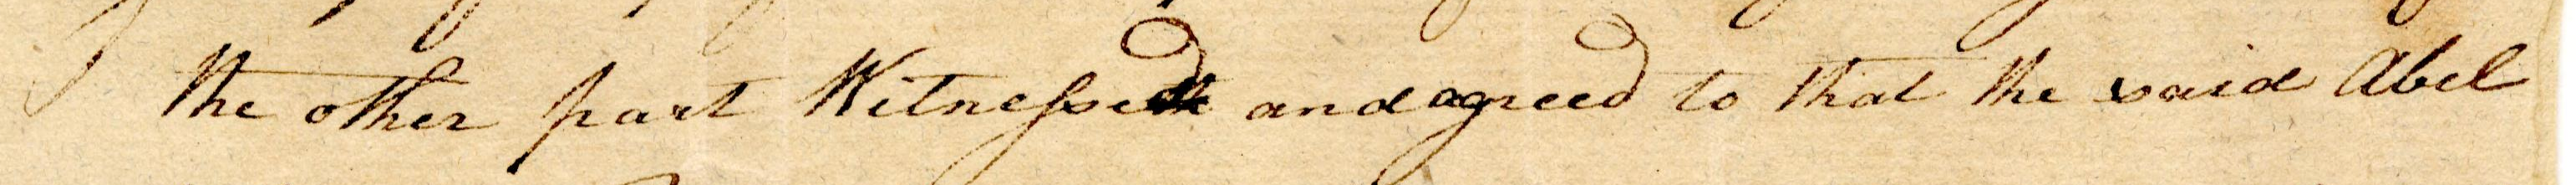the other part Witnessed and agreed to that the said Abel
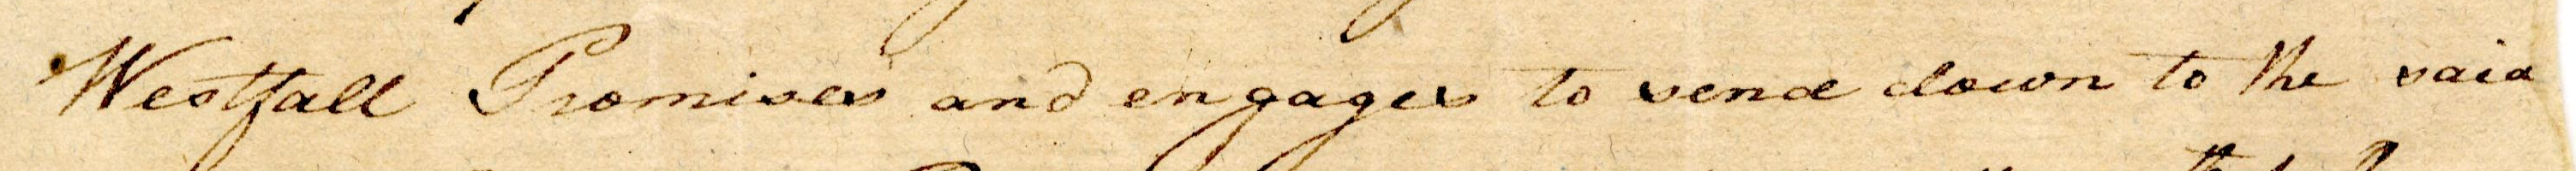Westfall Promises and engages to send down to the said
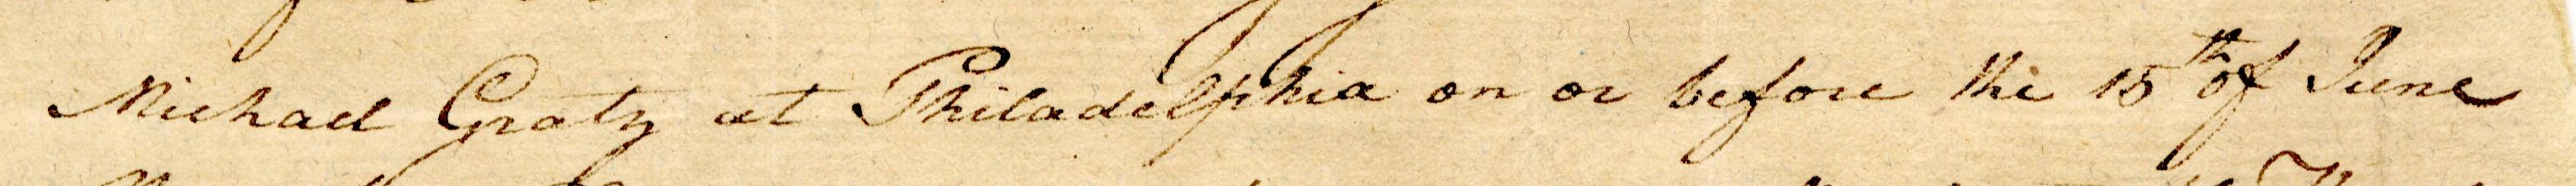Michael Gratz at Philadelphia on or before the 15^th of June
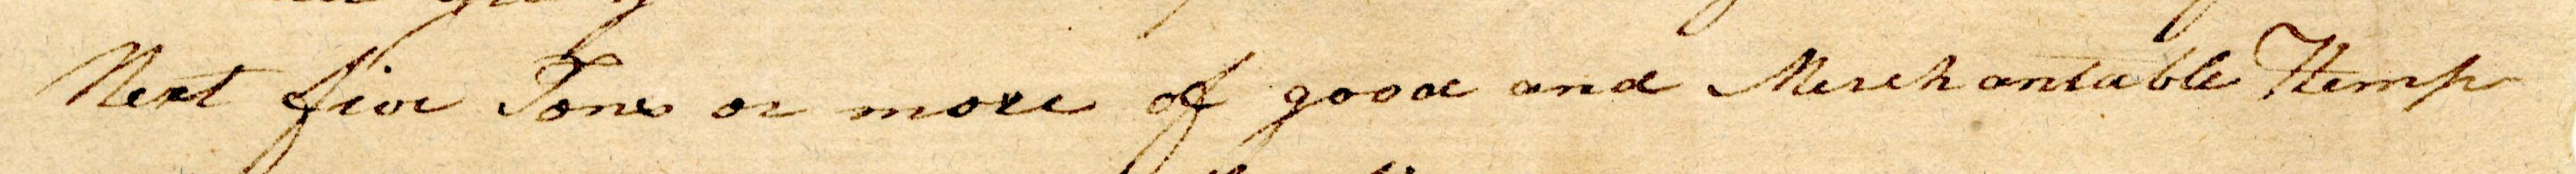next five Tons or more of good and Merchantable Hemp
